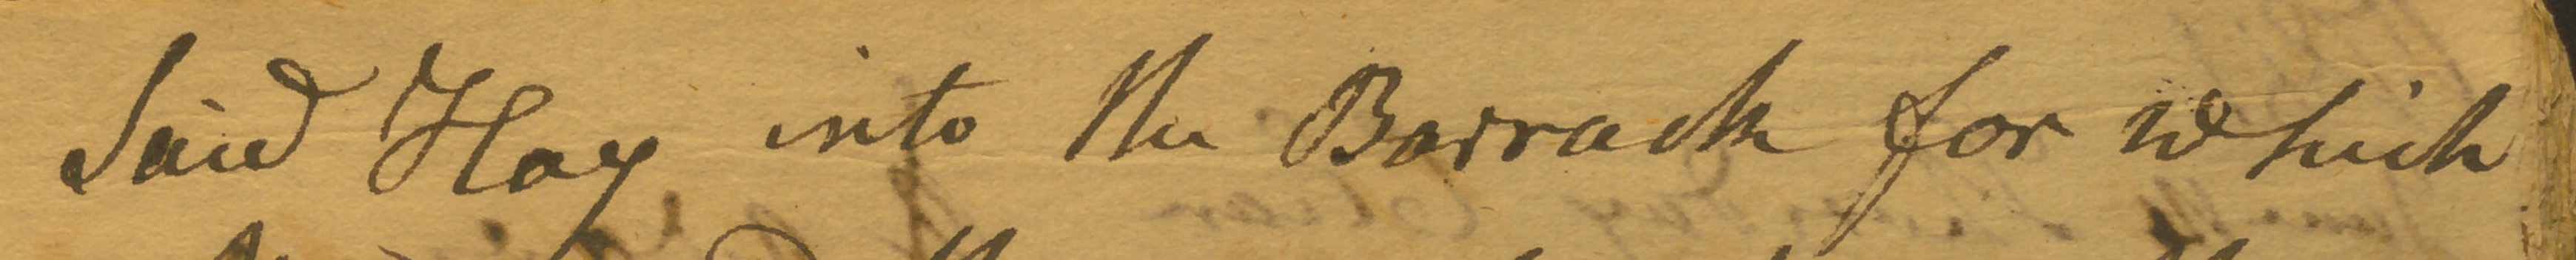Said Hay, into the Barrack for which
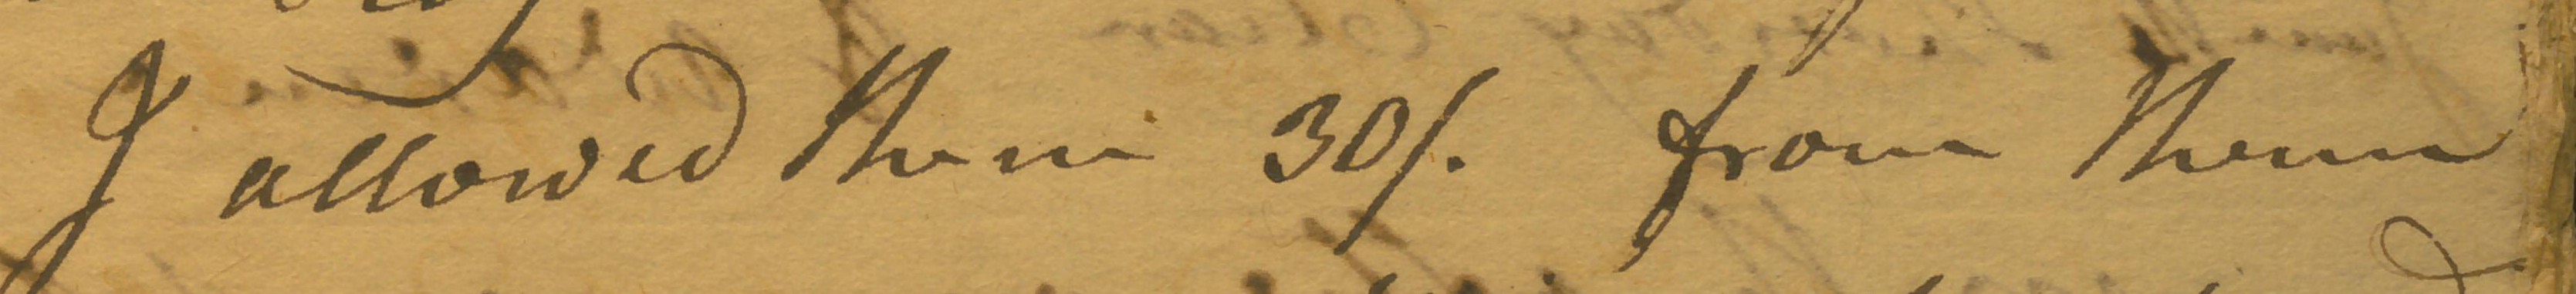I allowed then 30s. from thence
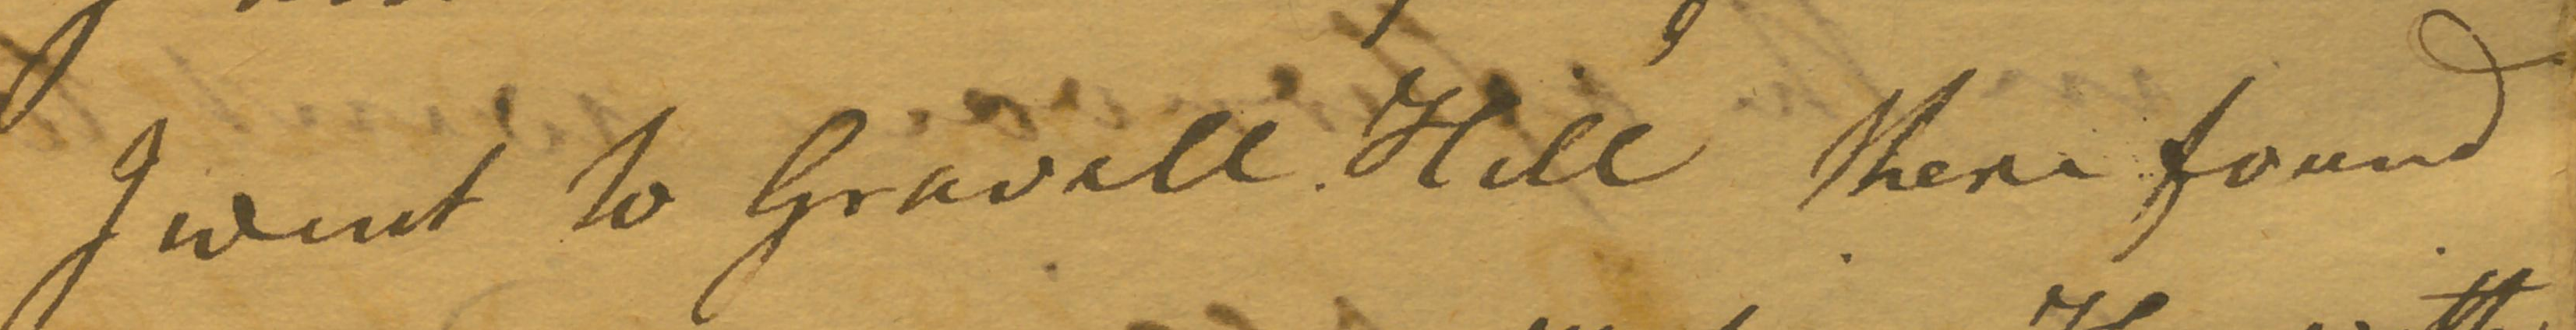I went to Gravell Hill there found
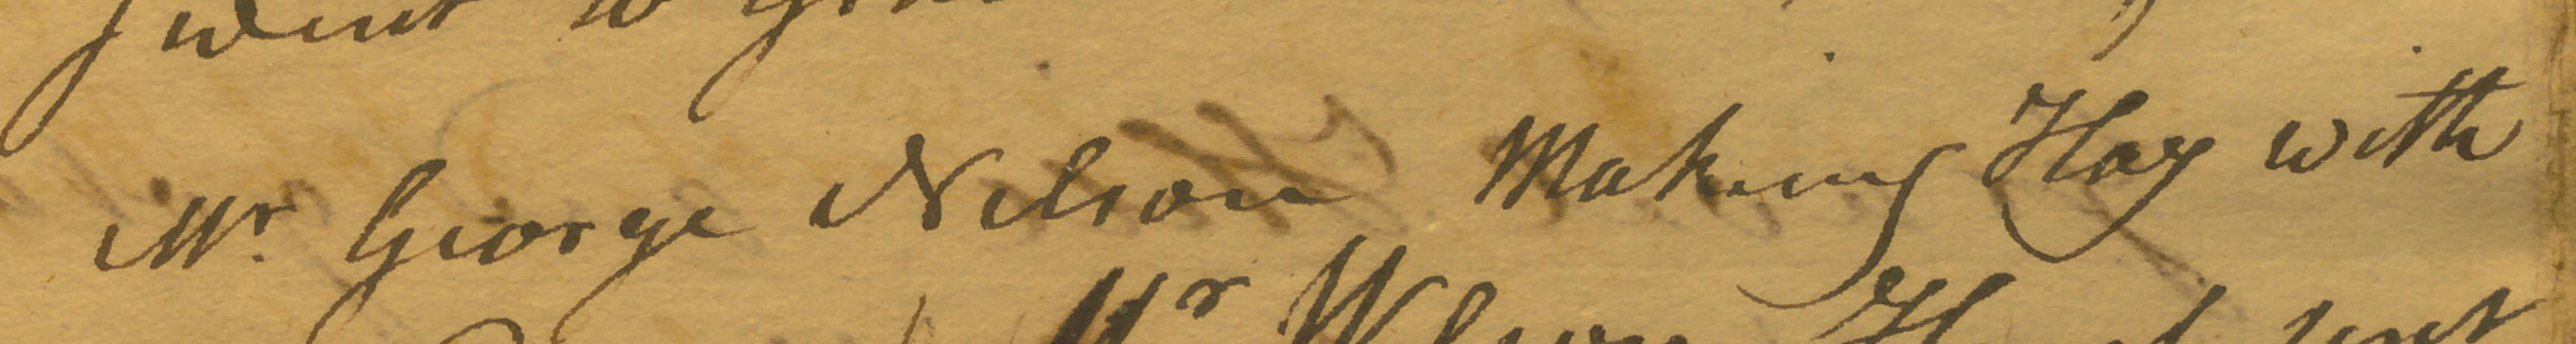M^r. George Nelson Making Hay with
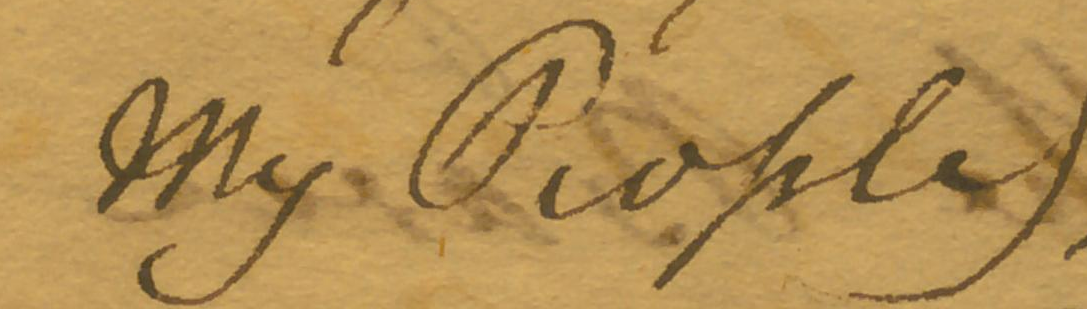My People
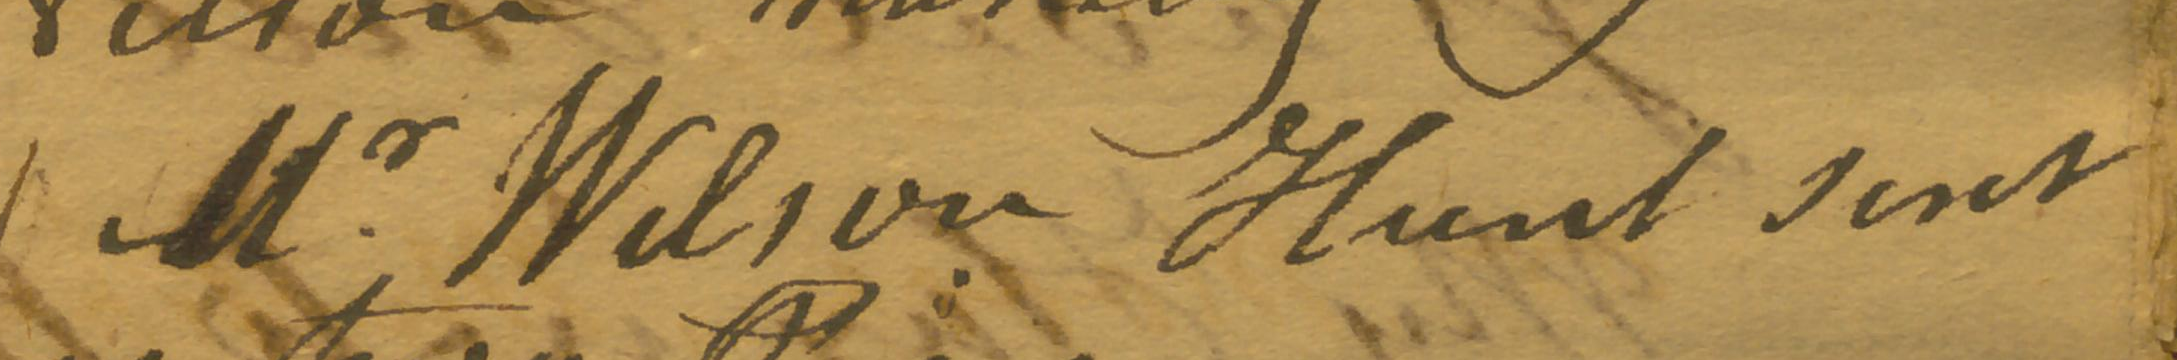M^r. Wilson Hunt sent
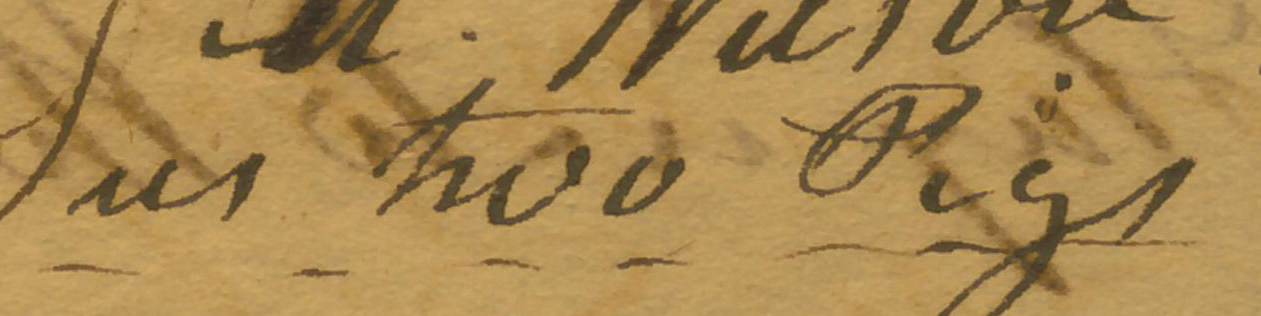us two Pigs
